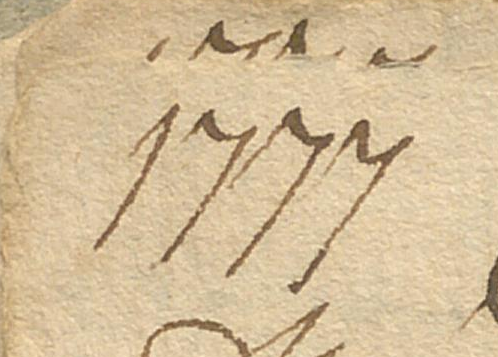1777
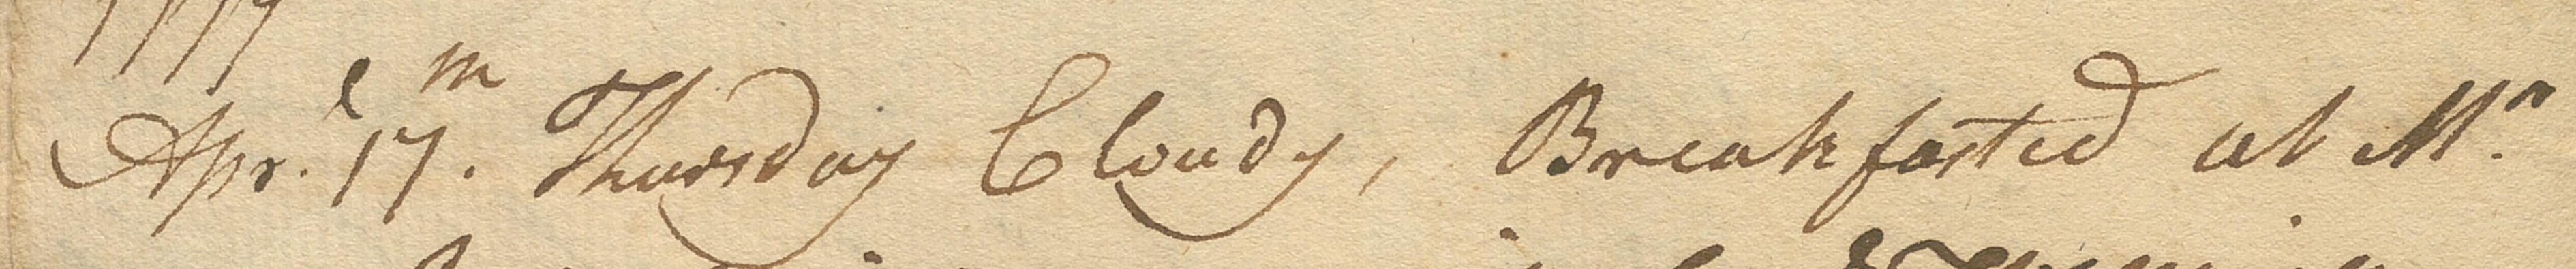Apr^l. 17^th. Thursday Cloudy, Breakfasted at M^r.
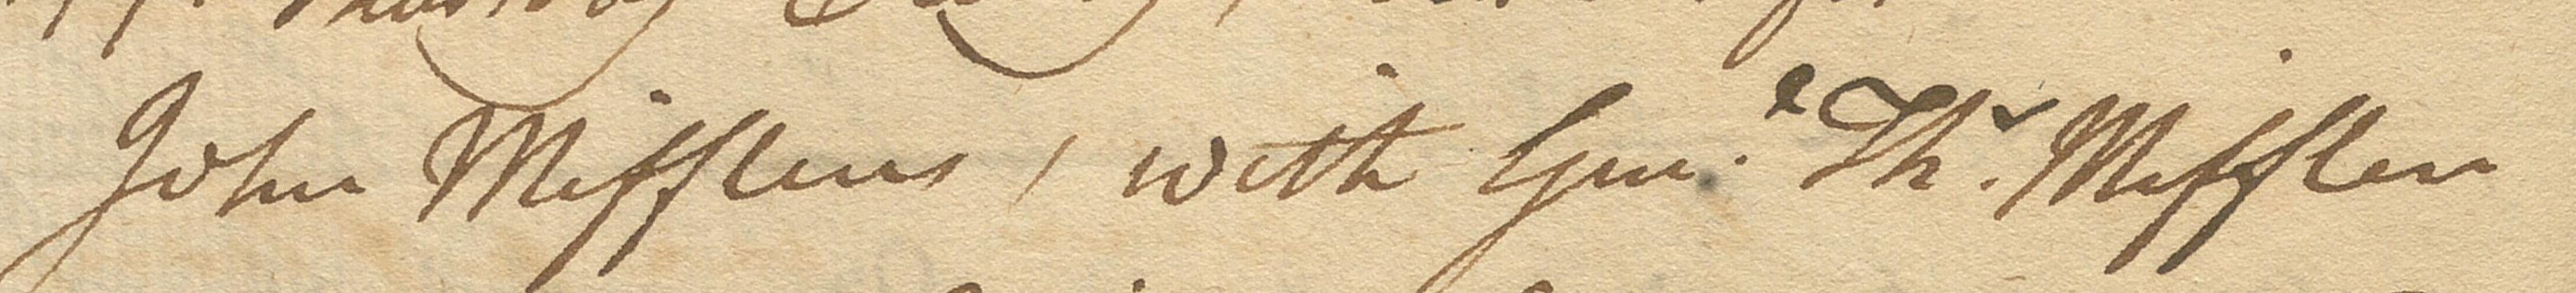John Mifflins, with Gen^l. Th^s. Mifflin
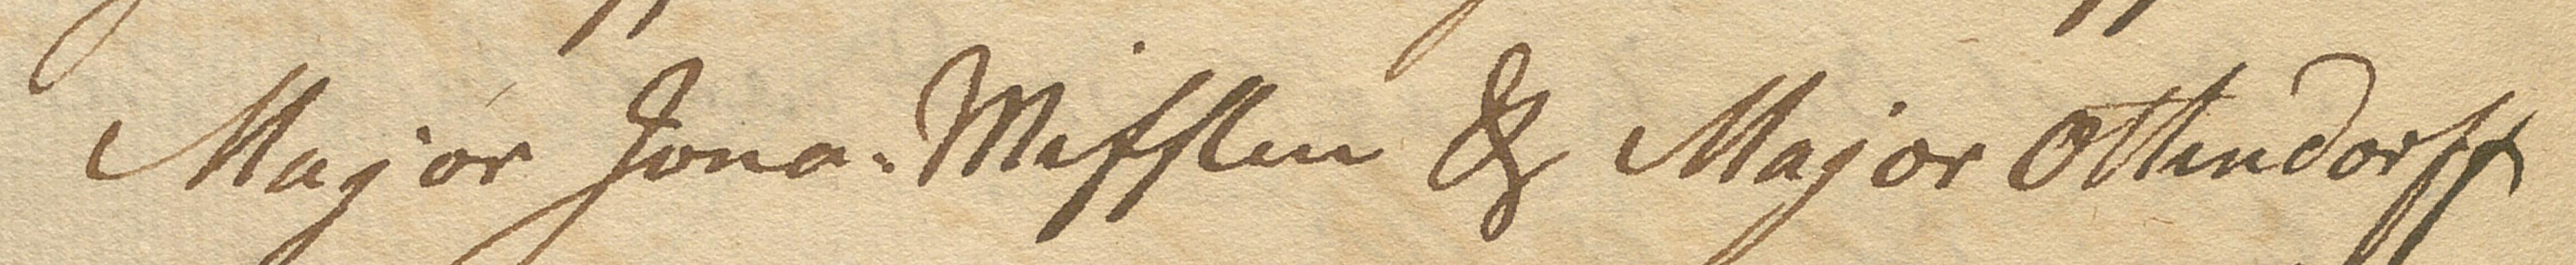Major Jona. Mifflin & Major Ottendorff
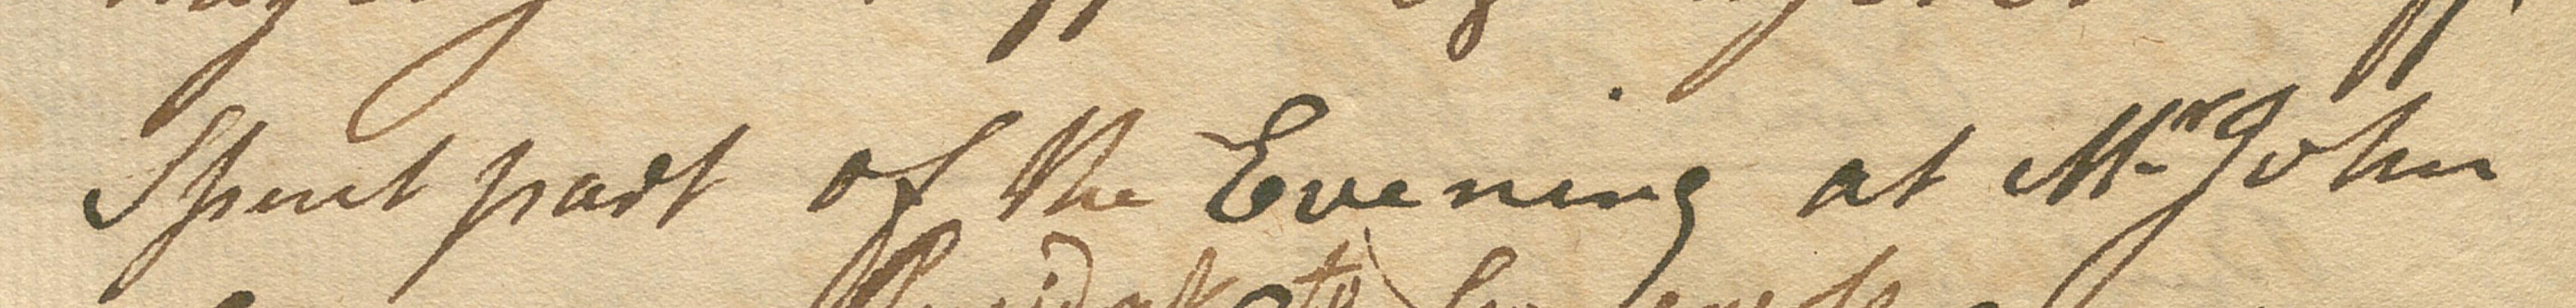Spent part of the Evening at M^r. John
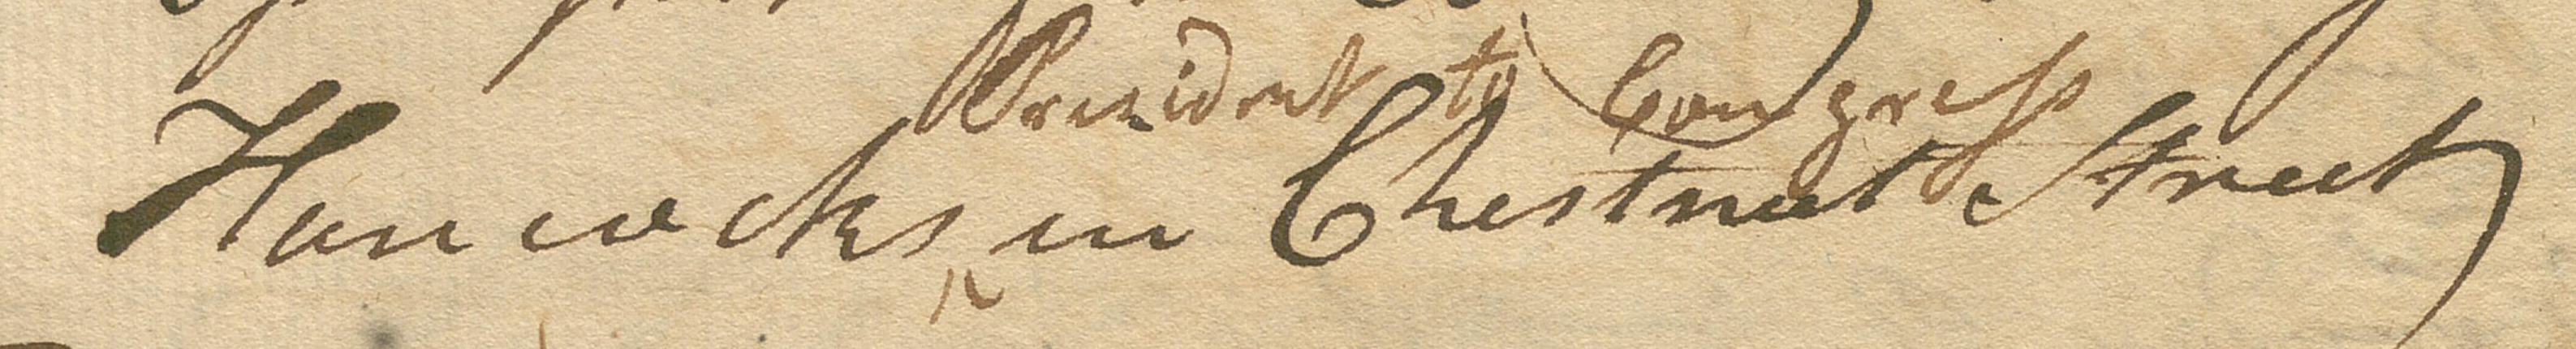Hancocks ^ in Chestnut Street
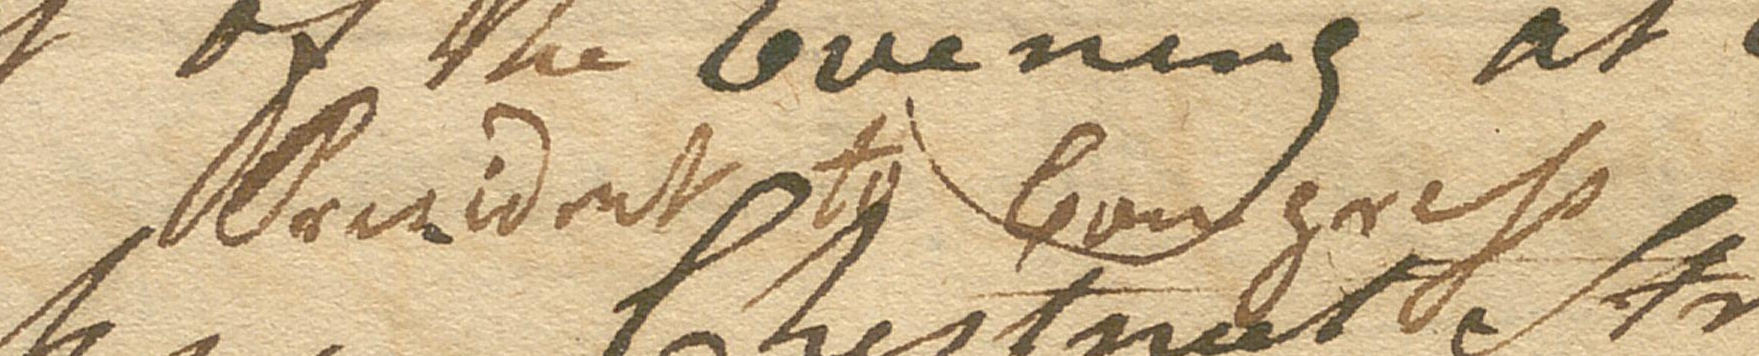President to Congress
